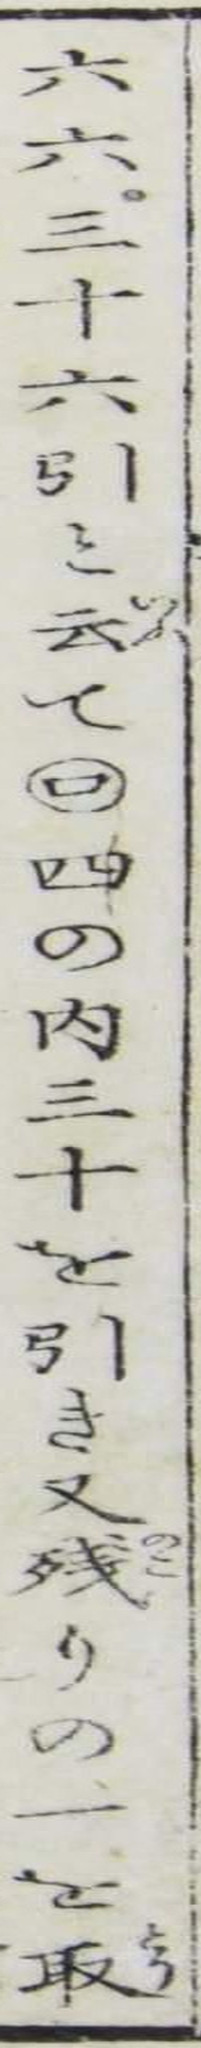六六．三十六引と云て㋺四の内三十を引き又残りの一を取
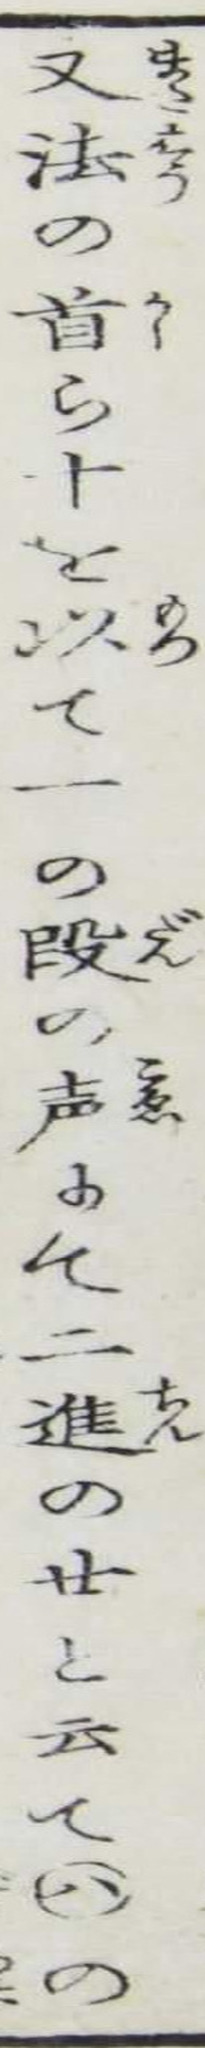又法の首ら十を以て一の段の声にて二進の廿と云て㋩の
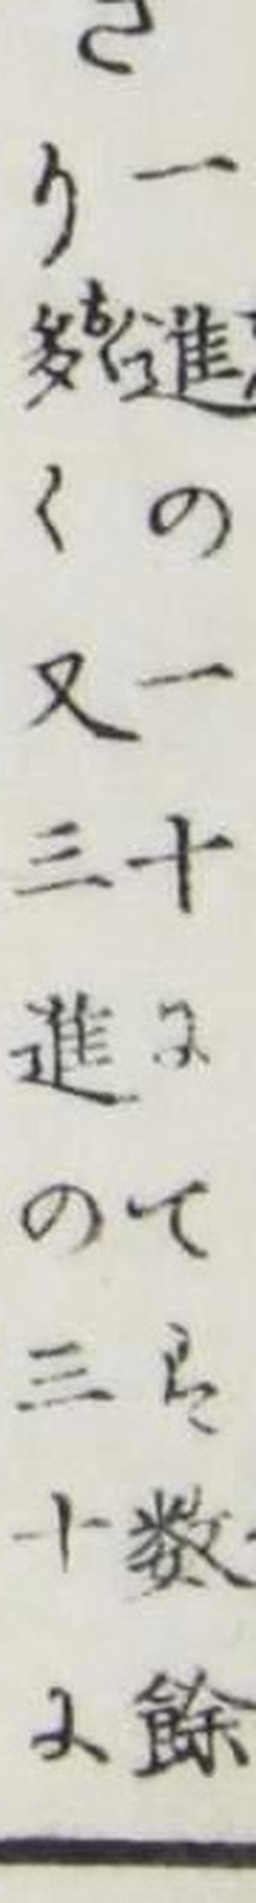り多く又三進の三十に
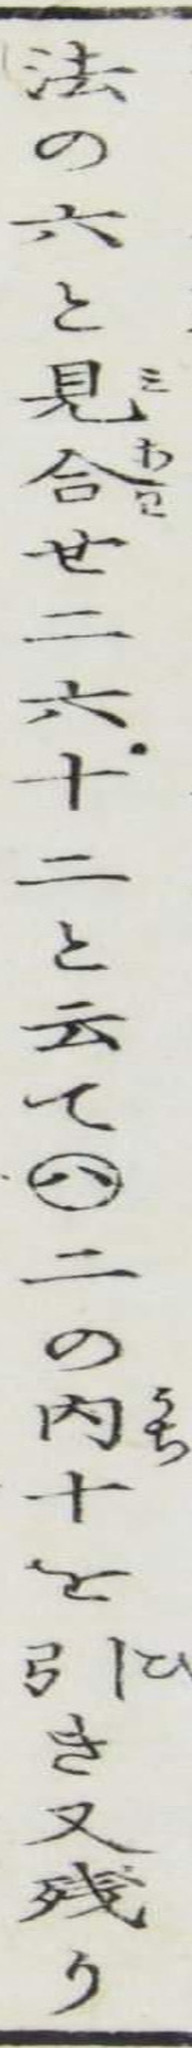法の六と見合せ二六．十二と云て㋩二の内十を引き又残り
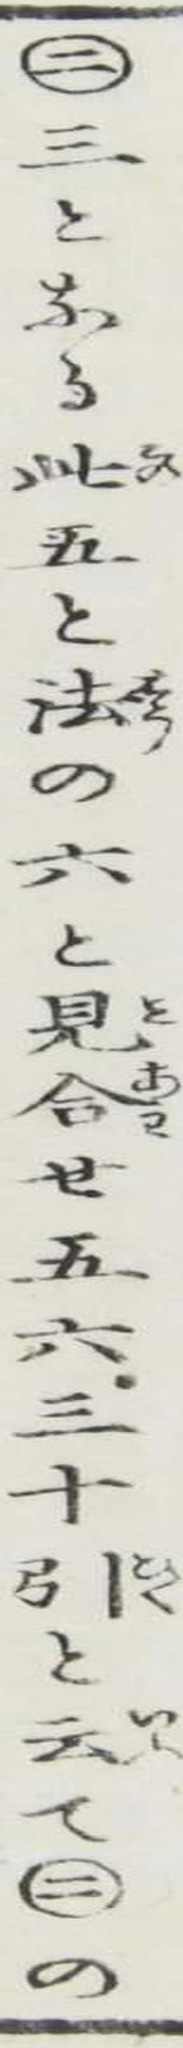㋥三となる此五と法の六と見合せ五六．三十引と云て㋥の
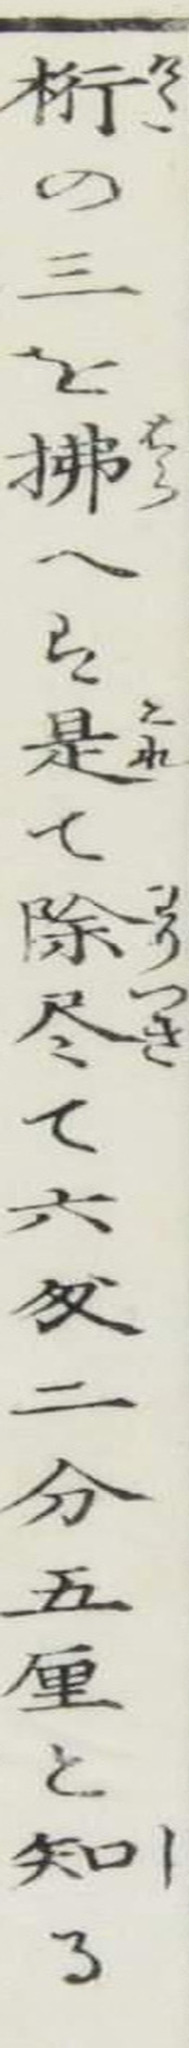桁の三を払へは是て除尽て六匁二分五厘と知る
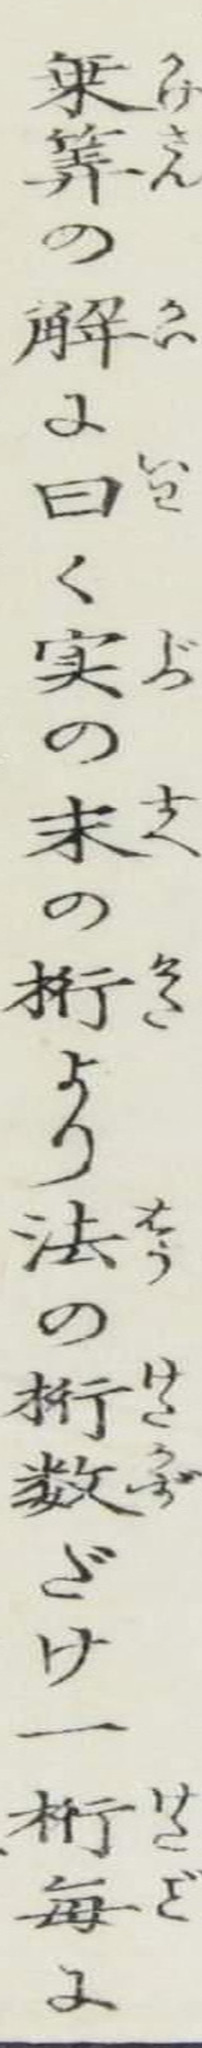乗算の解に曰く実の末の桁より法の桁数だけ一桁毎に
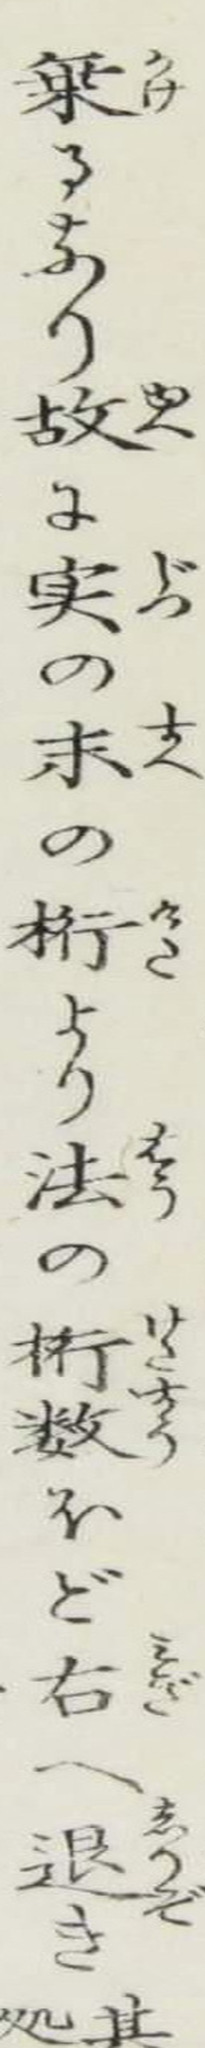乗るなり故に実の末の桁より法の桁数ほど右へ退き其処
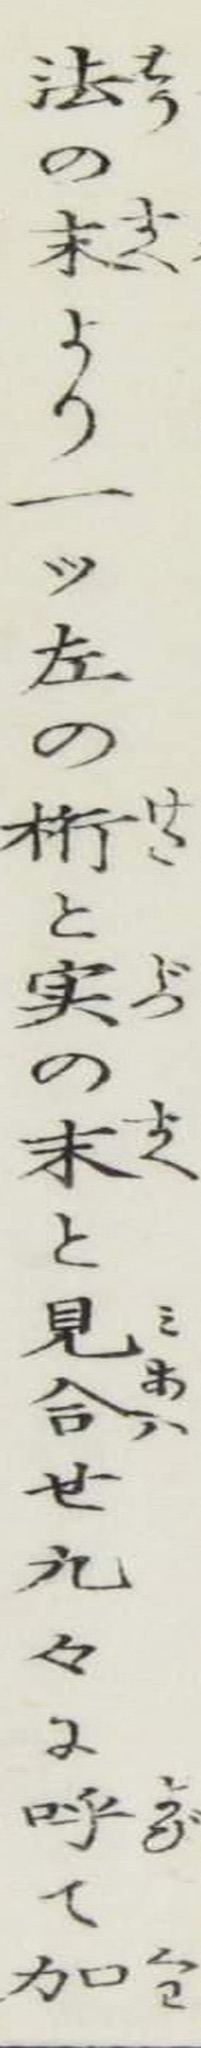法の末より一ツ左の桁と実の末と見合せ九々に呼て加
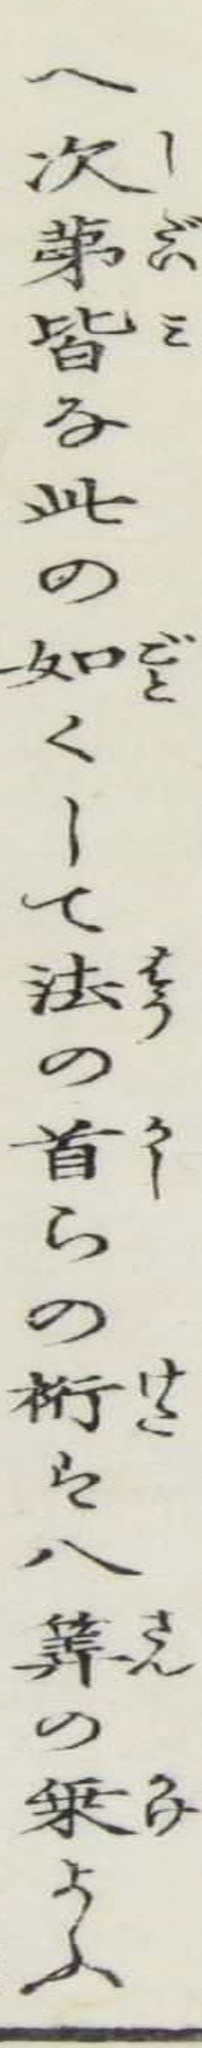へ次第皆な此の如くして法の首らの桁は八算の乗よふ
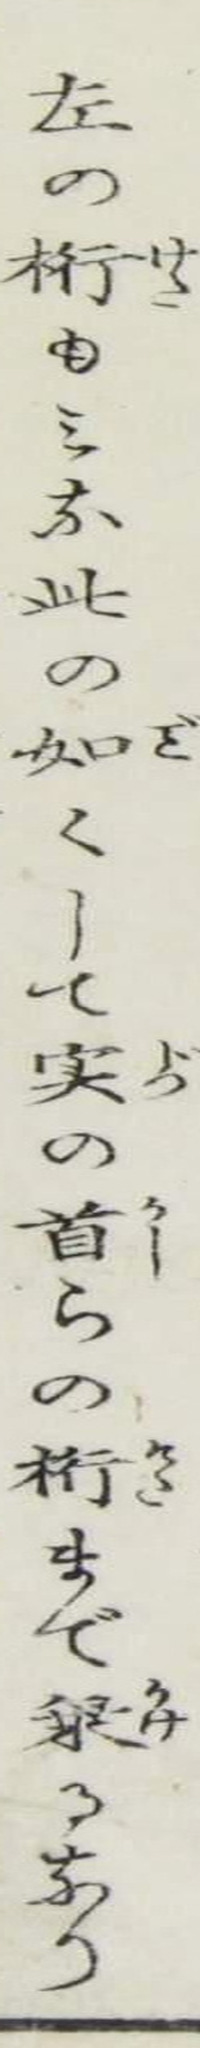左の桁もみな此の如くして実の首らの桁まで乗るなり
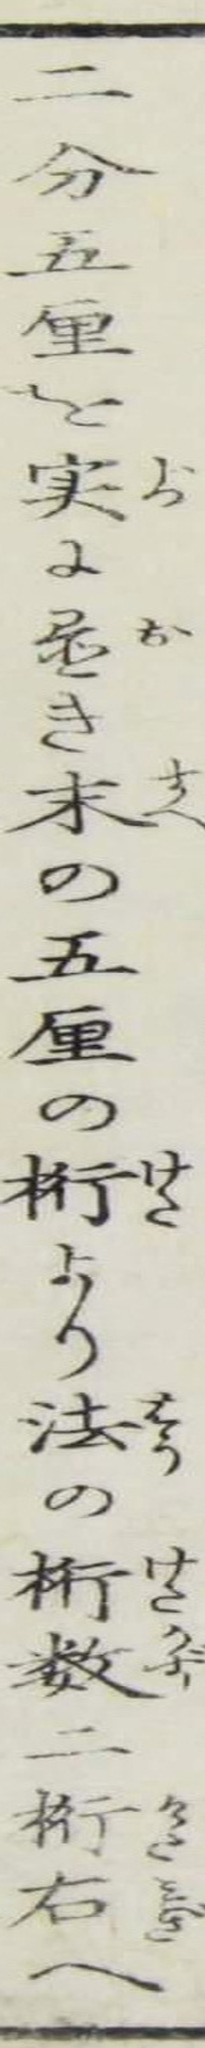二分五厘を実に置き末の五厘の桁より法の桁数二桁右へ
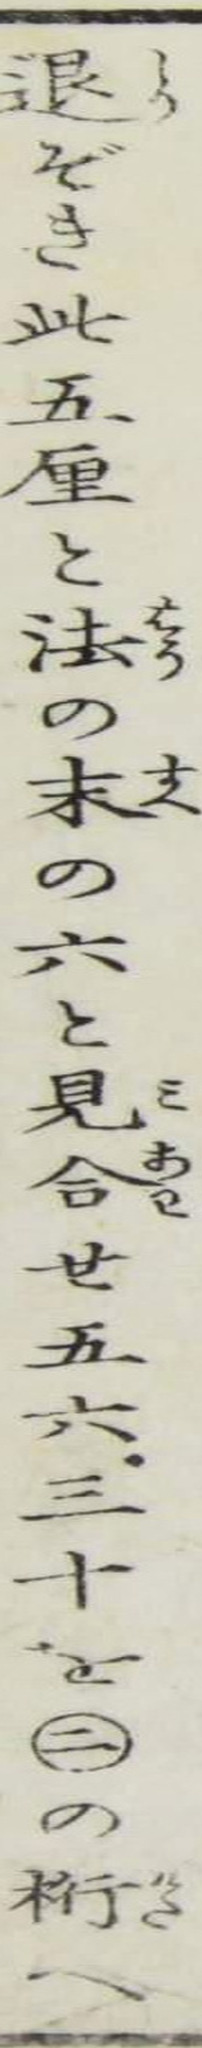退ぞき此五厘と法の末の六と見合せ五六．三十を㋥の桁へ

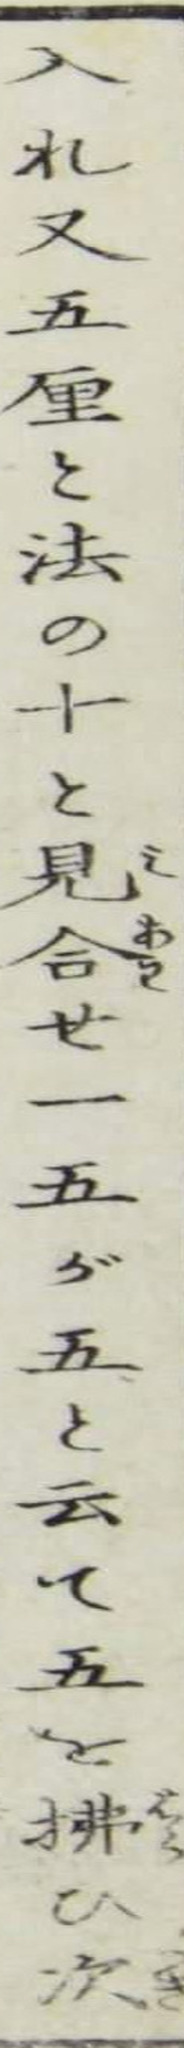入れ又五厘と法の十と見合せ一五が五と云て五を払ひ次
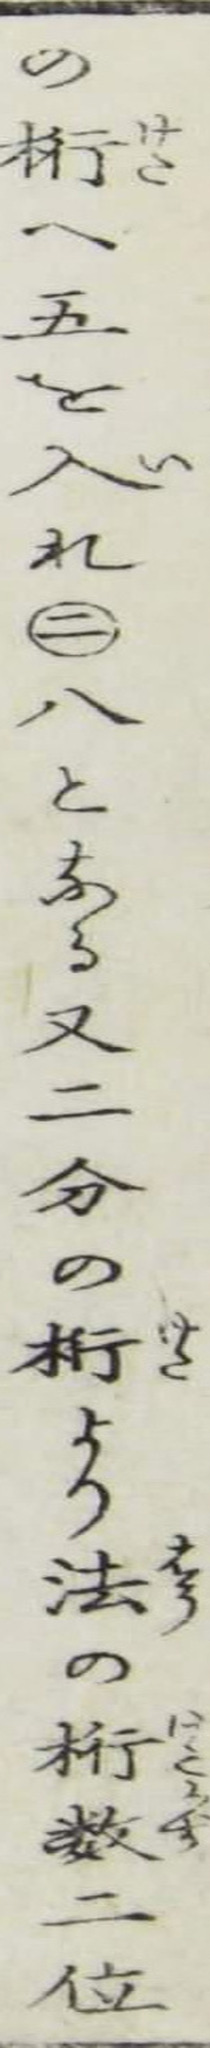の桁へ五を入れ㋥八となる又二分の桁より法の桁数二位
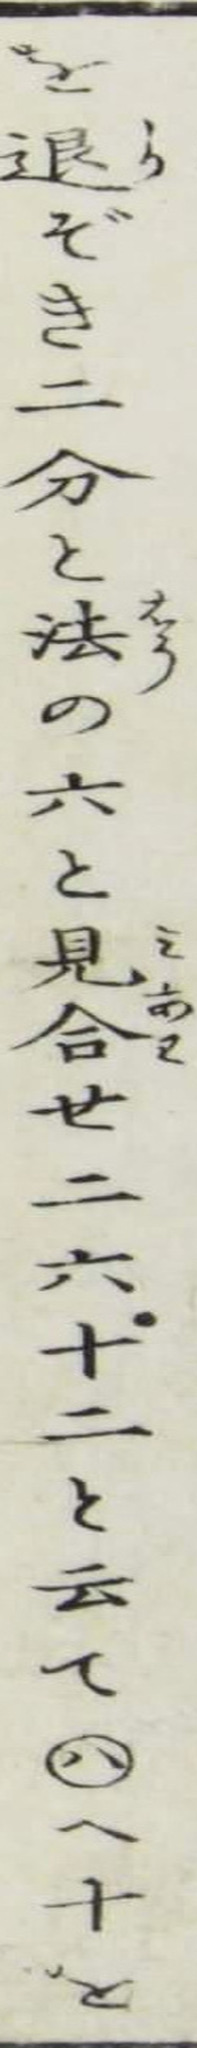を退ぞき二分と法の六と見合せ二六．十二と云て㋩へ十を
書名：明治小學塵劫記 卷1
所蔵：東京学芸大学教育コンテンツアーカイブ
